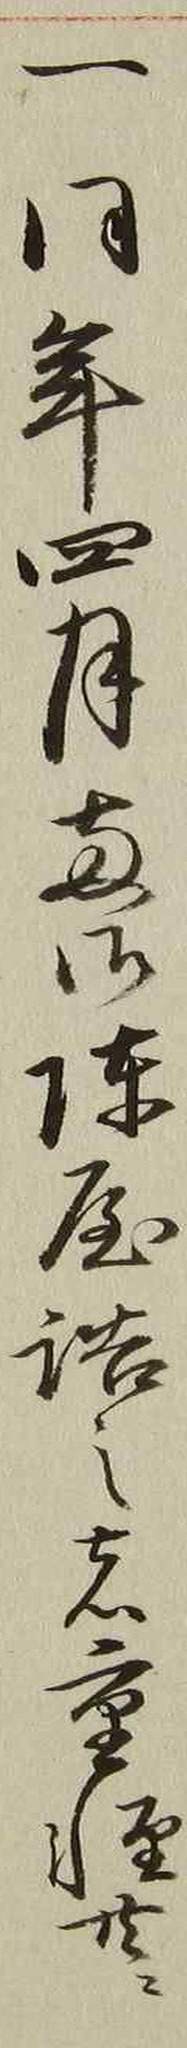一同年四月両陳屋詰之者重軽共ニ
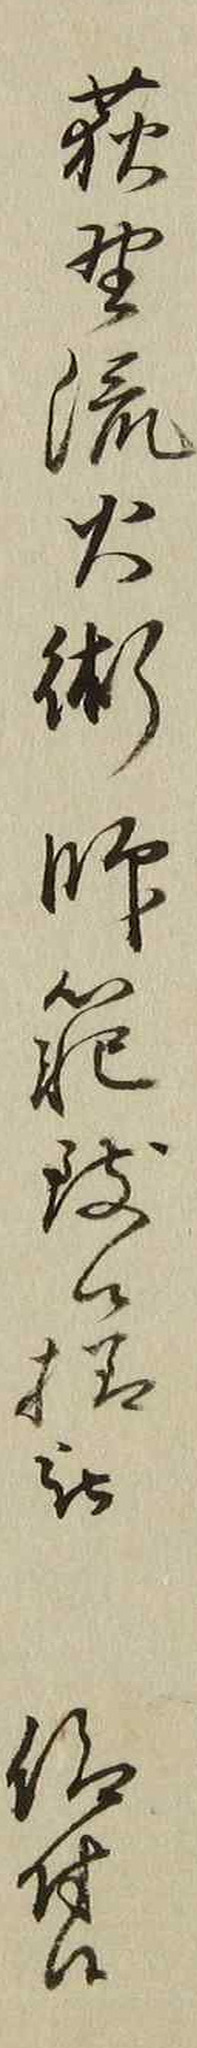荻野流火術師範致候様被仰付候
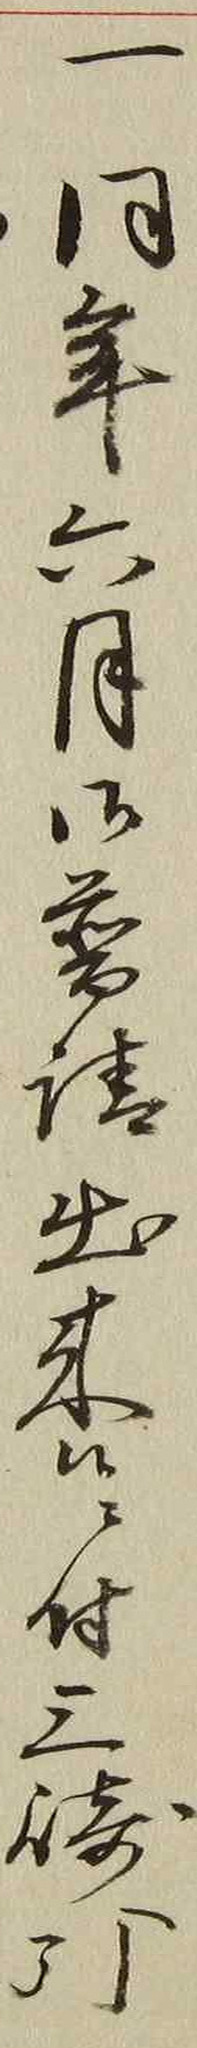一同年六月御普請出来候ニ付三崎へ引
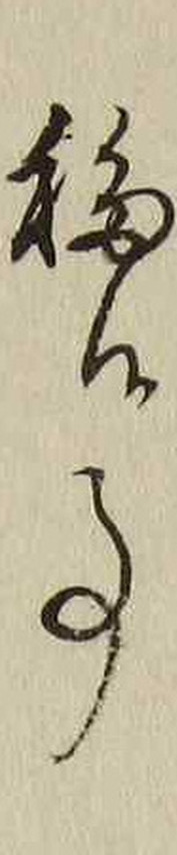移候事
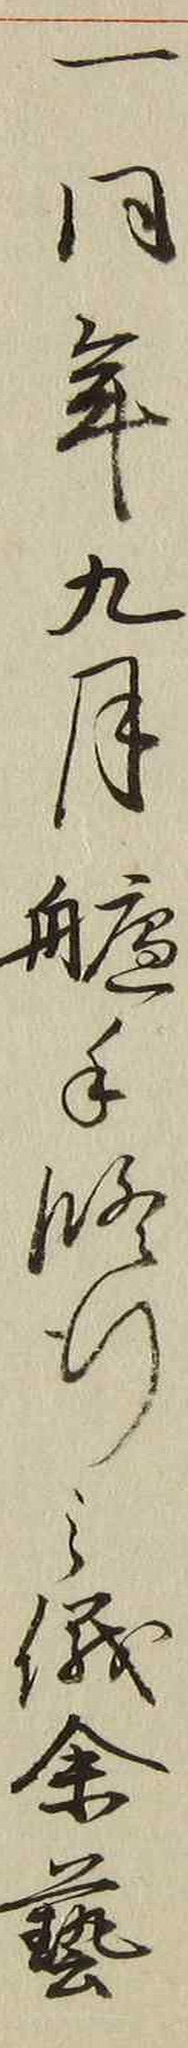一同年九月艇手修行之儀余芸
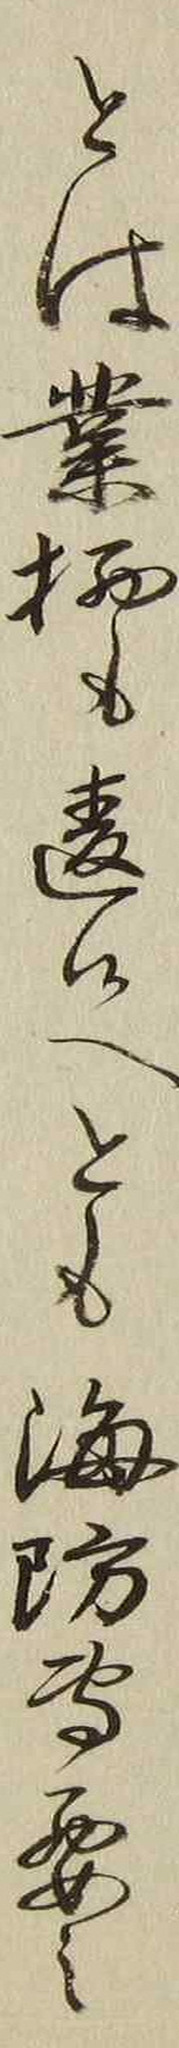とは業柄も違候へとも海防専要之
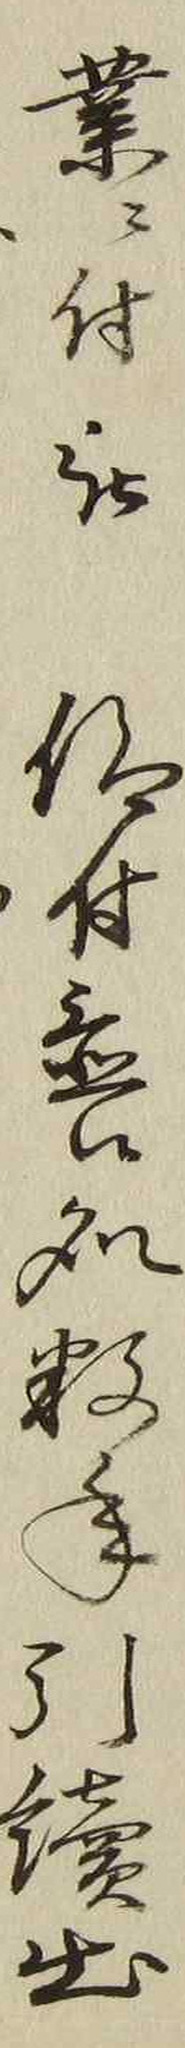業ニ付被仰付置候処数年引続出
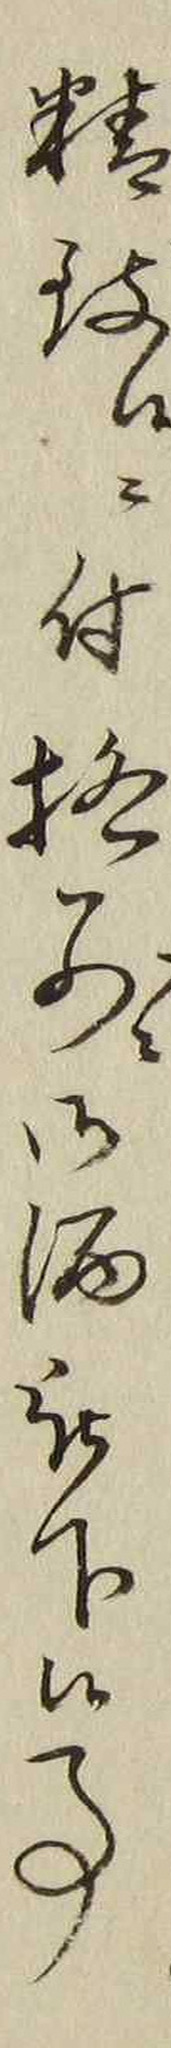精致候ニ付格別ニ御酒被下候事
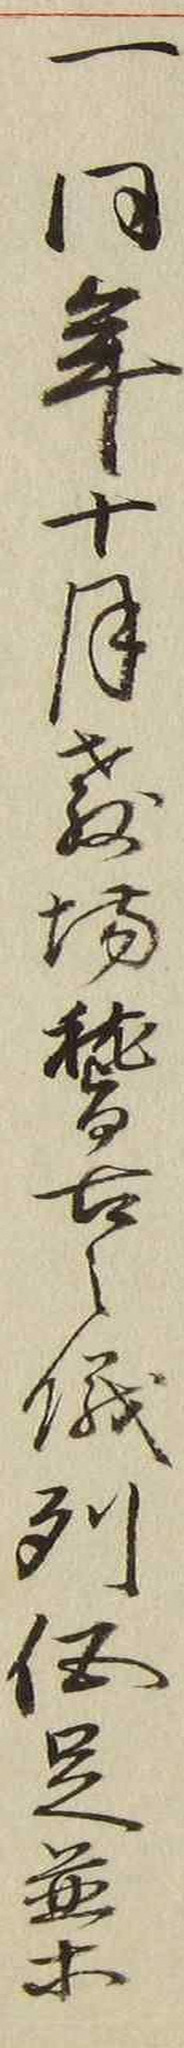一同年十月教場稽古之儀列伍足並等
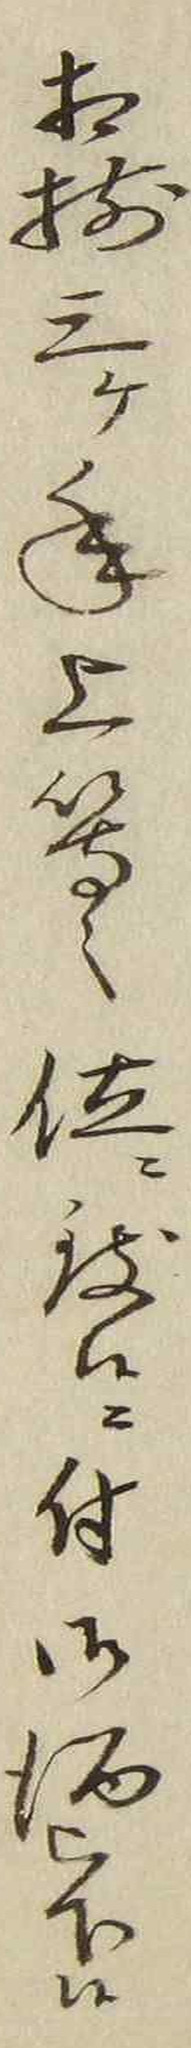相揃三ヶ年上等之位ニ致候ニ付御酒被下候

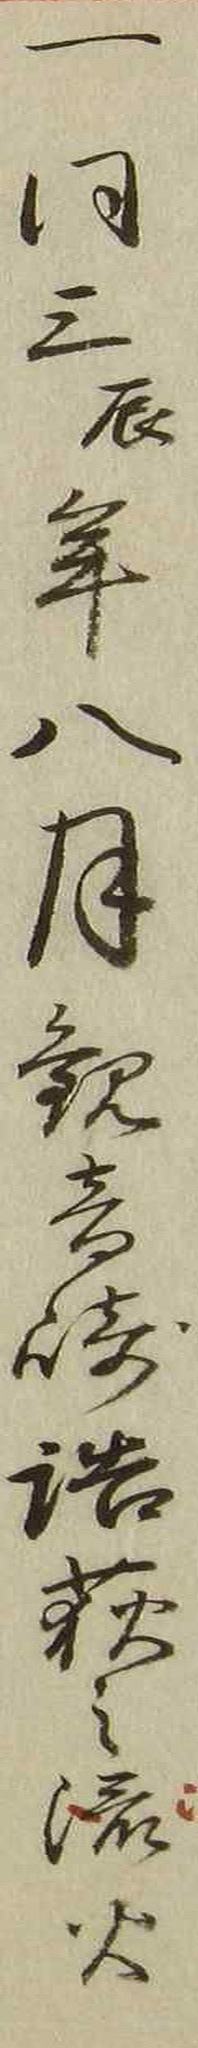一同三辰年八月観音崎詰荻之流火
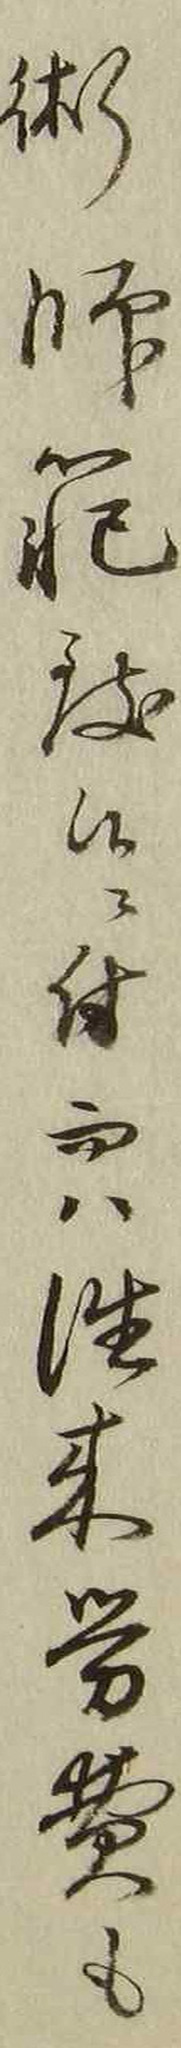術師範致候ニ付而ハ往来労費も
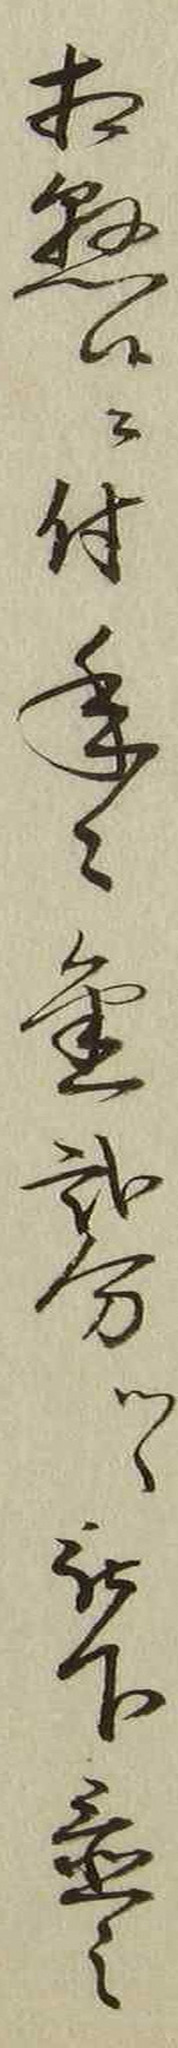相懸候ニ付年々金弐分ツヽ被下置之
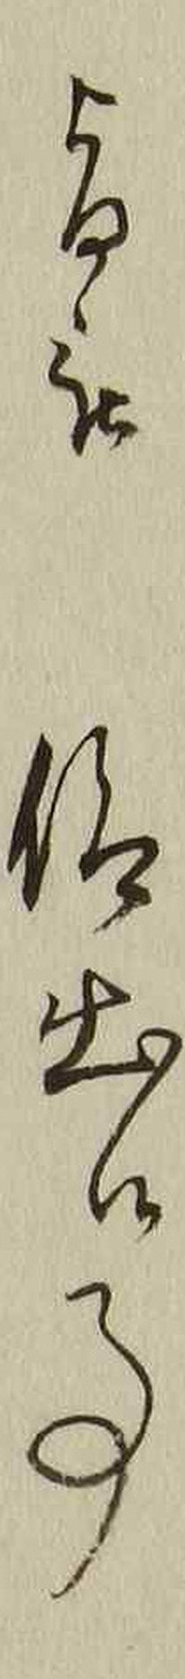旨被仰出候事
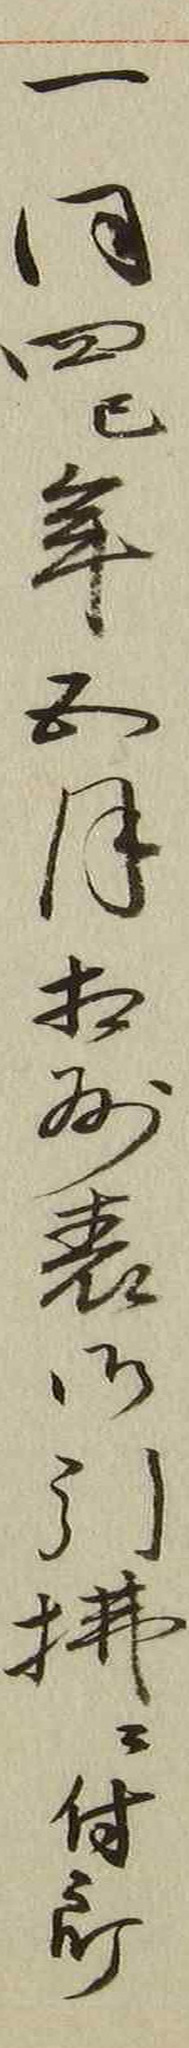一同四巳年五月相州表御引払ニ付郎
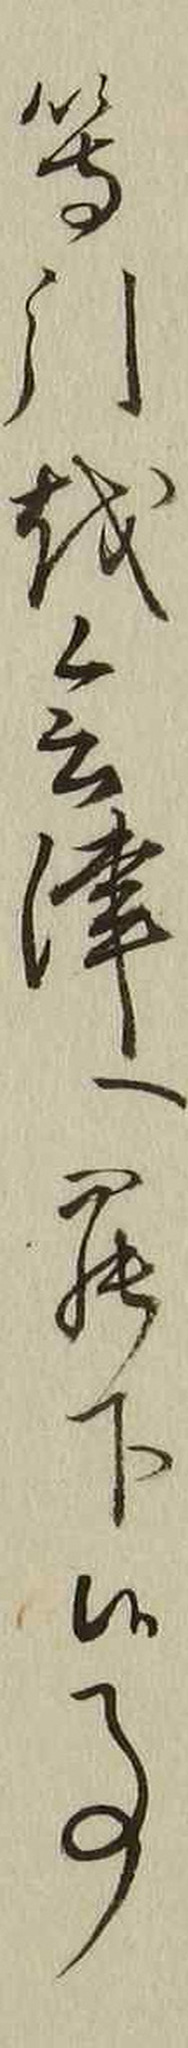等引越会津へ罷下候事
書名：諸士系譜　巻之114　か之部22
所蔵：会津若松市立会津図書館
